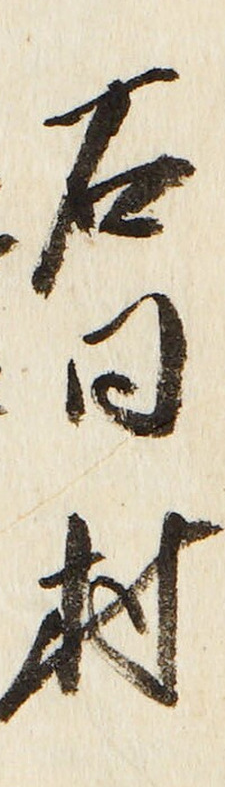右同村
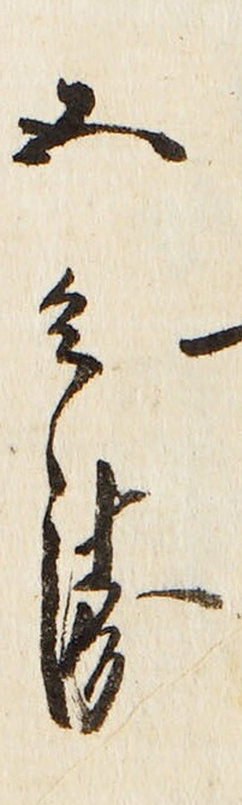五兵衛
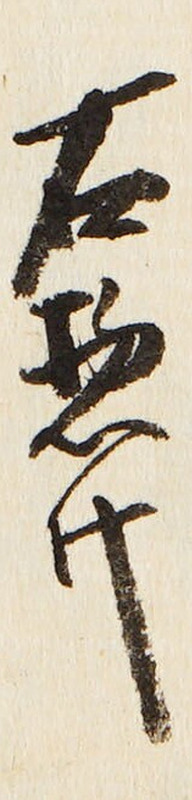右惣代
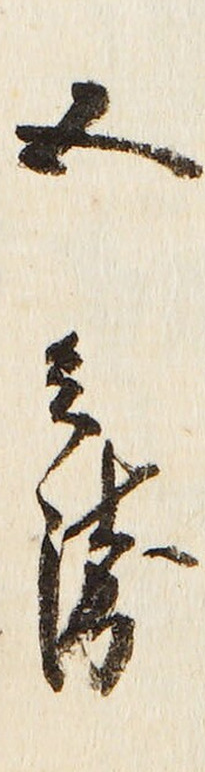五兵衛
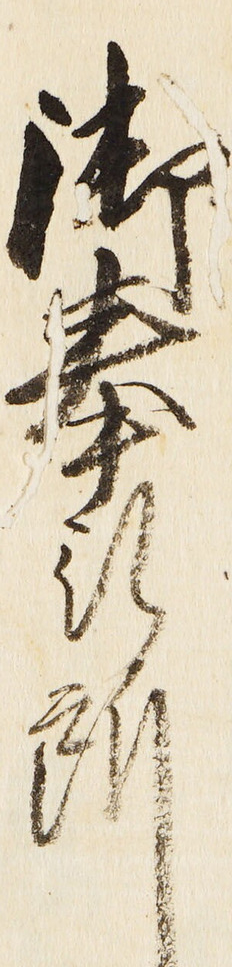御奉行所
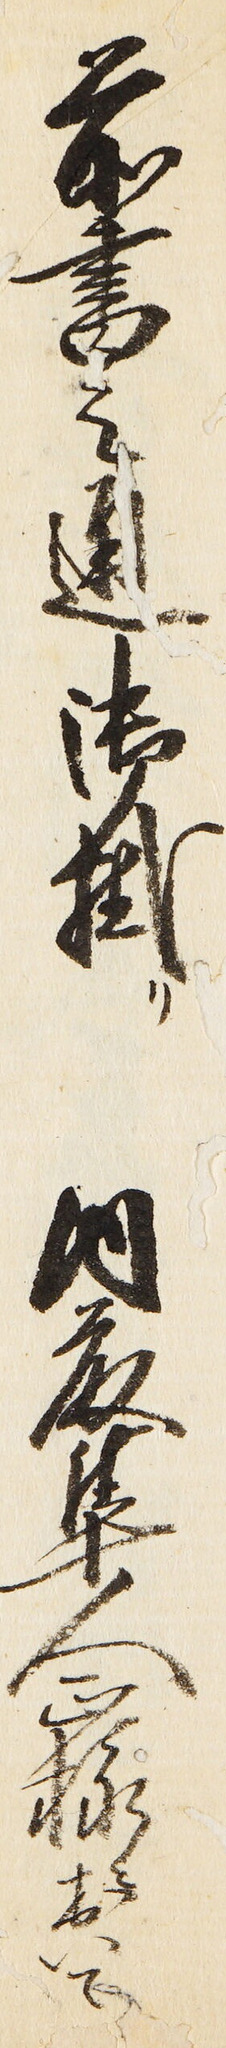前書之通御掛り内藤隼人正様ニおいて
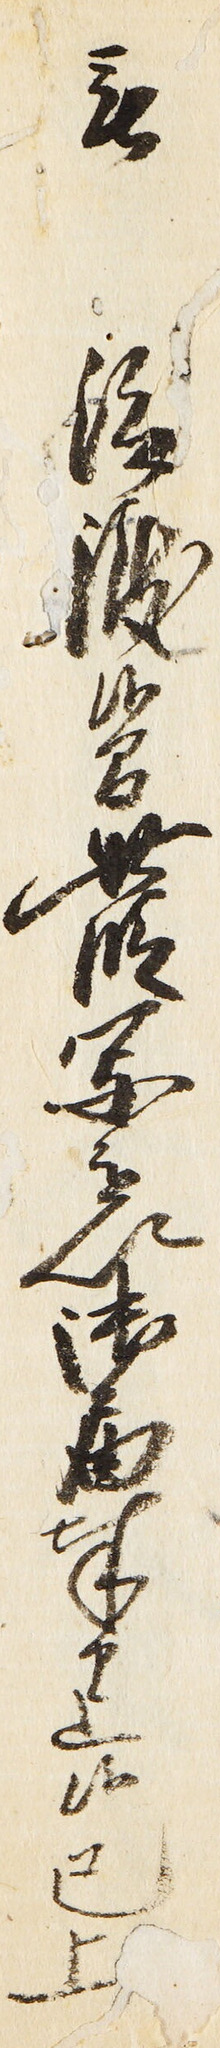被仰渡候間此段写を以御届奉申上候已上
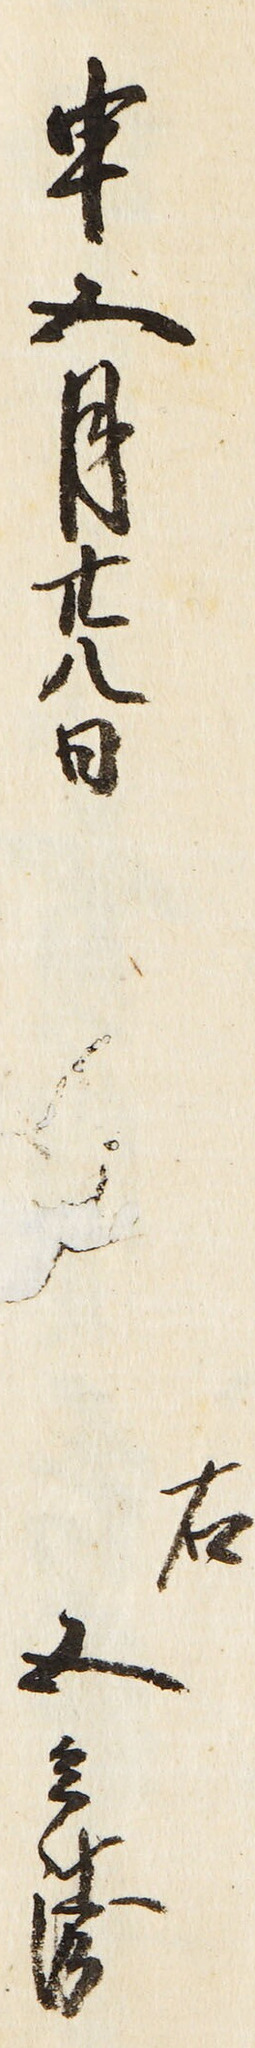申五月廿八日右五兵衛
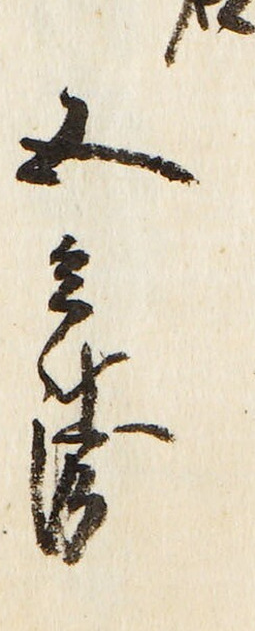五兵衛
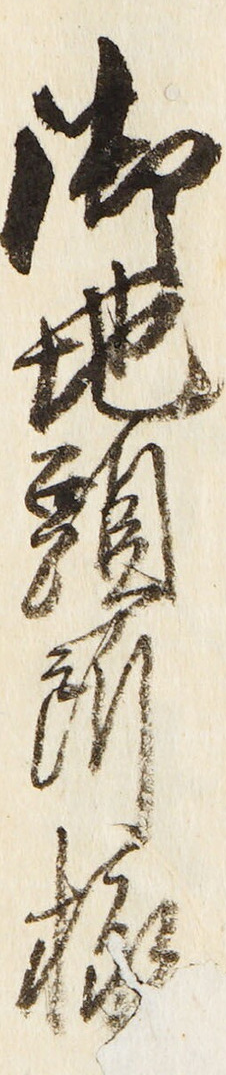御地頭所様
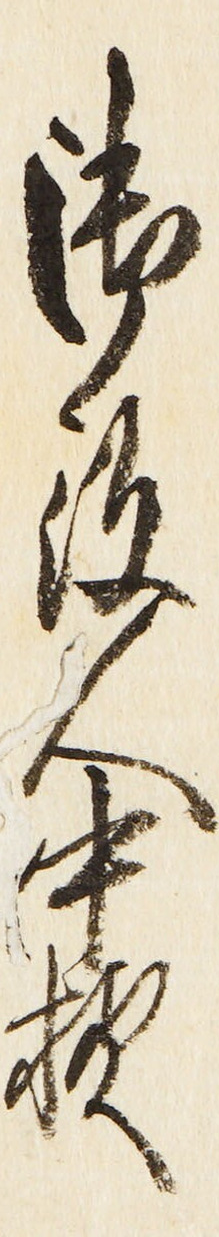御役人中様
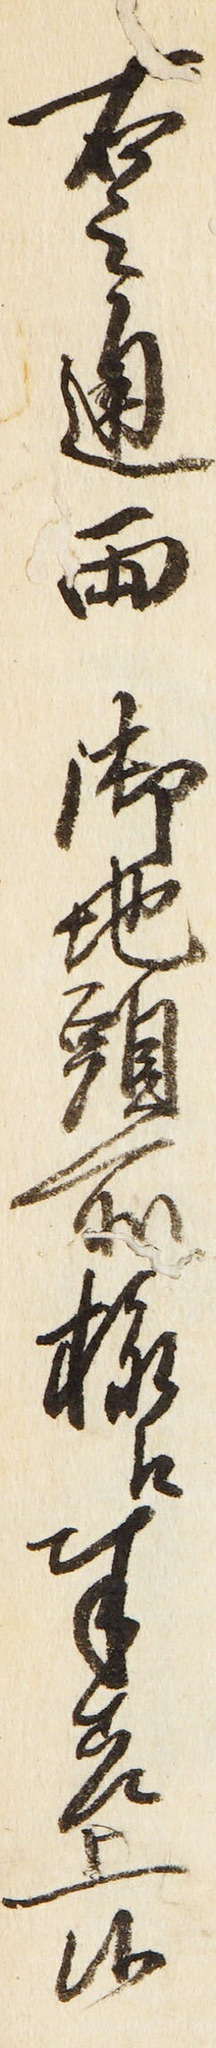右之通両御地頭所様江奉差上候

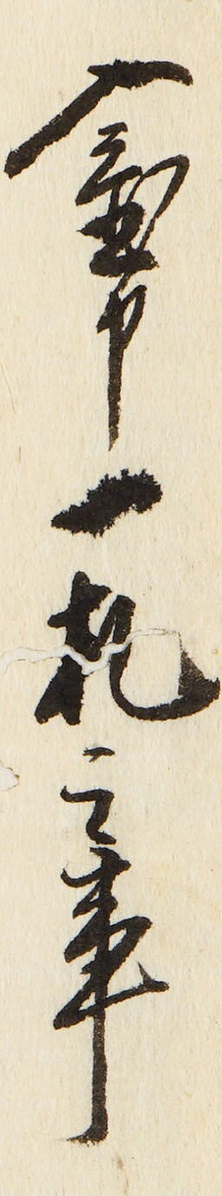入置申一札之事
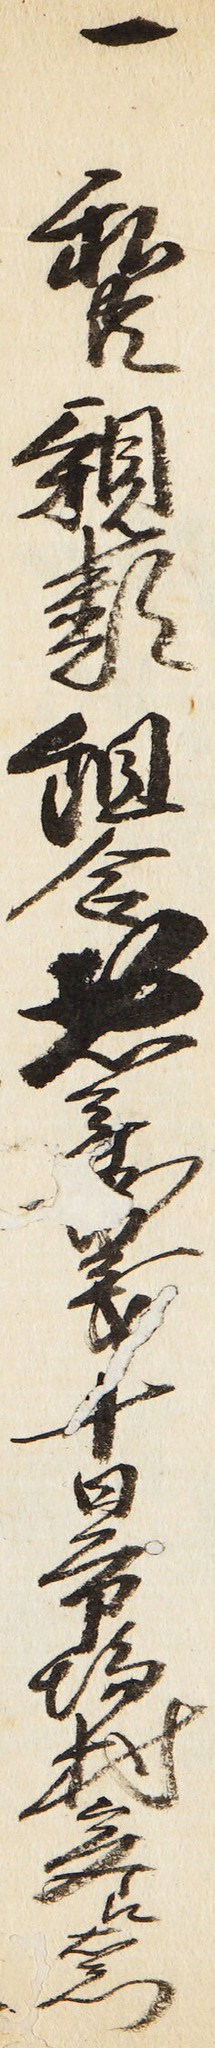一私共親類組合惣兵衛義十日市場村多郎右衛門
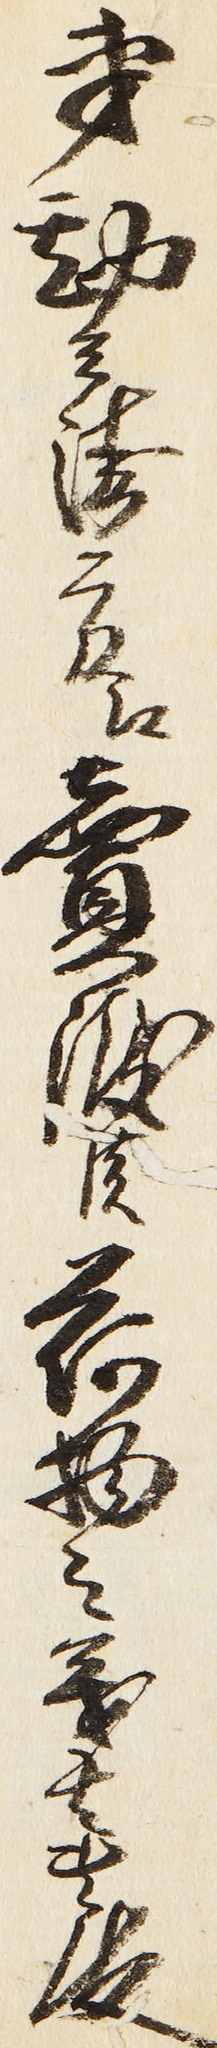弟勘兵衛方江売渡候荷物之義者貴殿
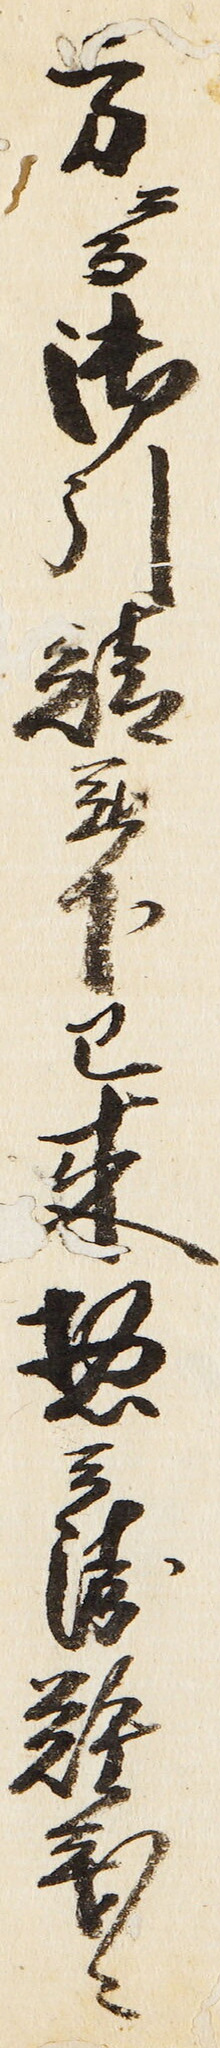方ニ而御引請被下已来惣兵衛難義ニ
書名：難船一件記録
